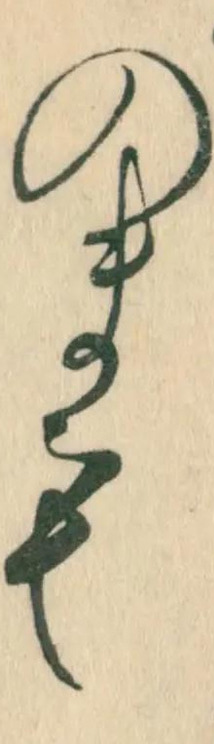のまも
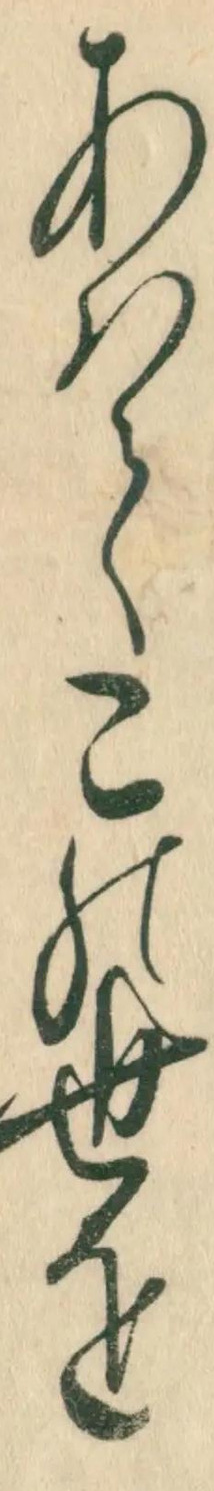あはてこの世を
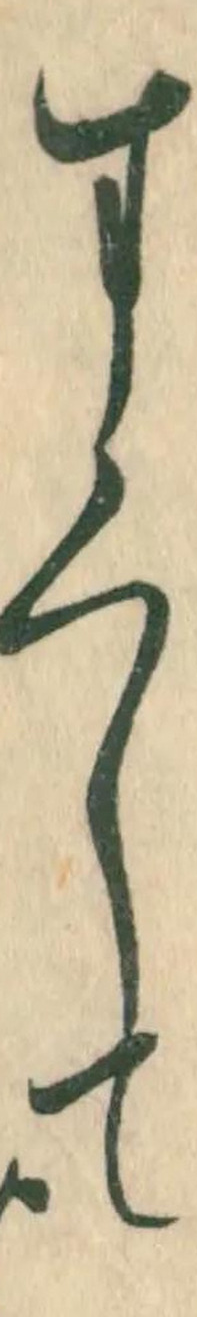すくして

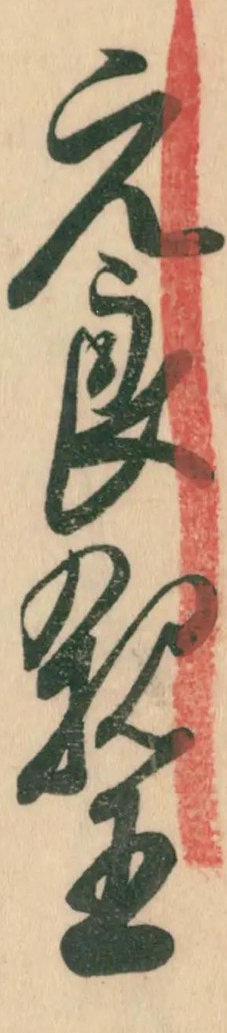元良親王
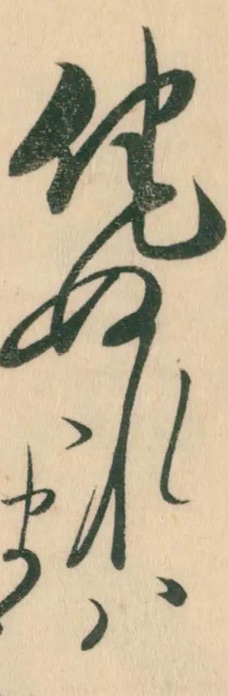侘ぬれは
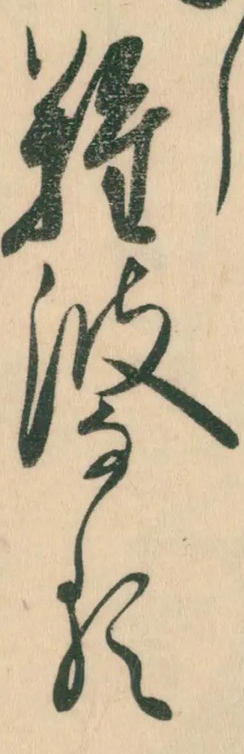難波なる
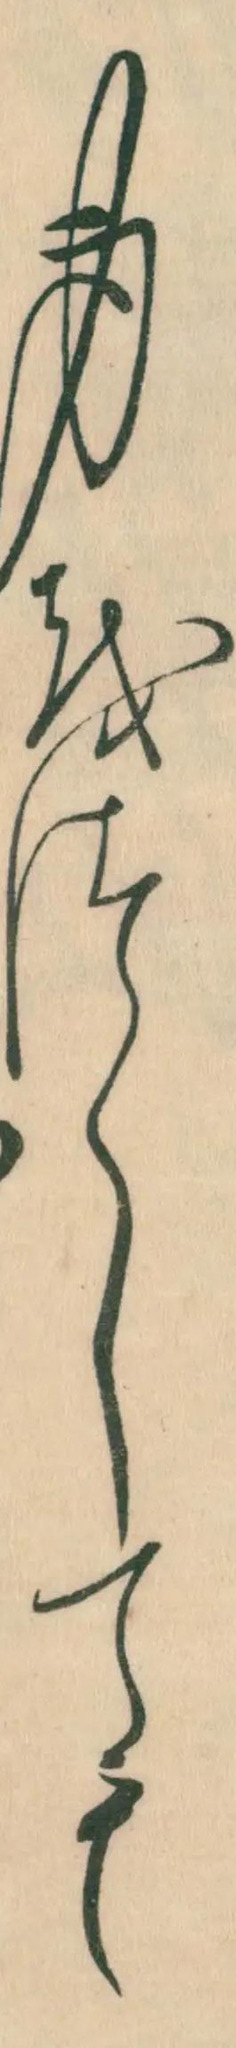身をつくしても
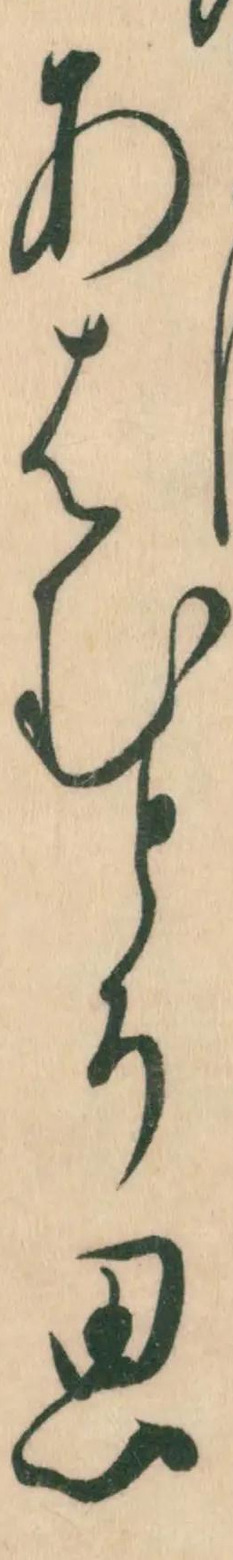あはむとそ思
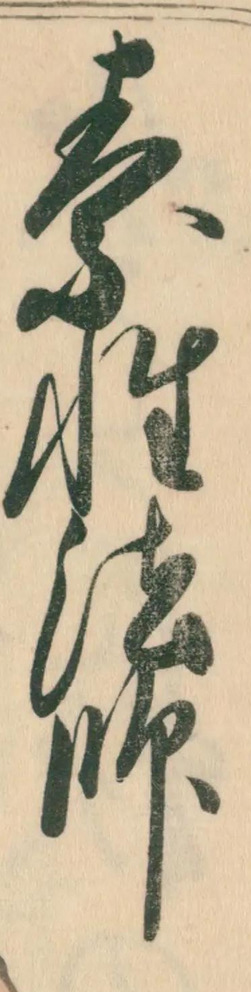素性法師
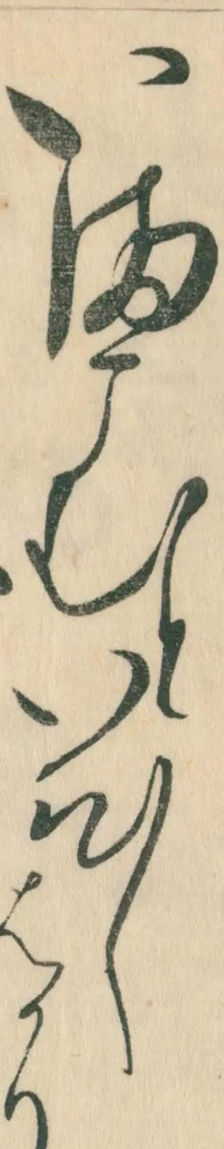いまこむといひし
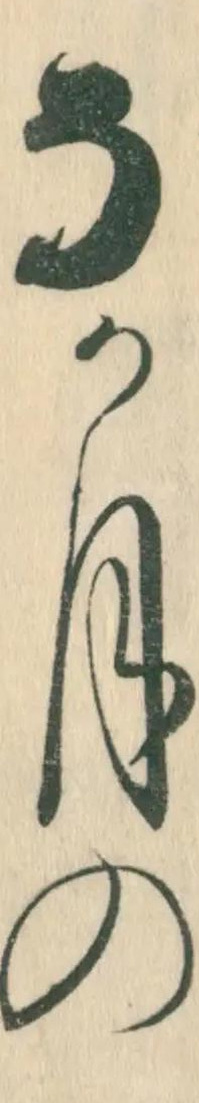なか月の
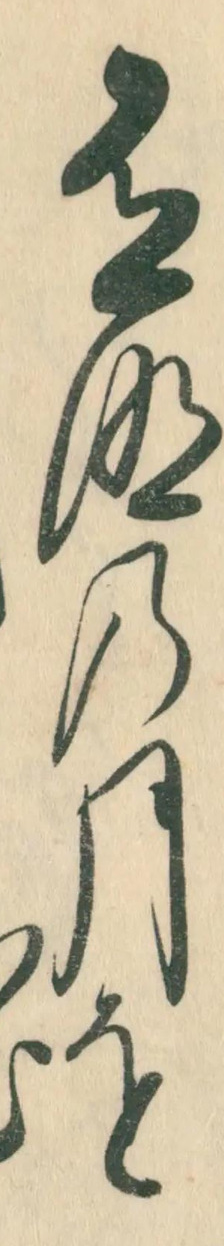有明の月を
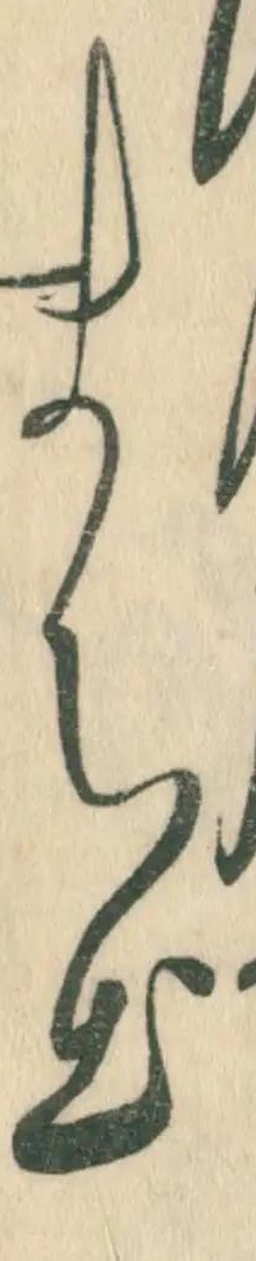まち出
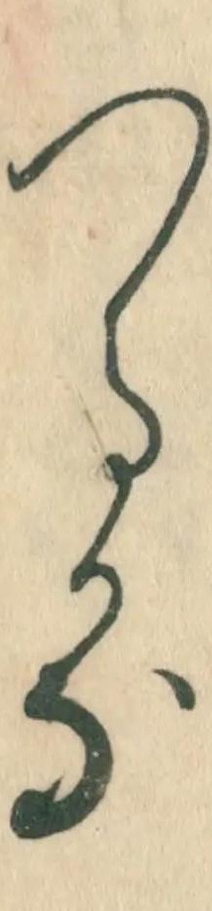つるかな

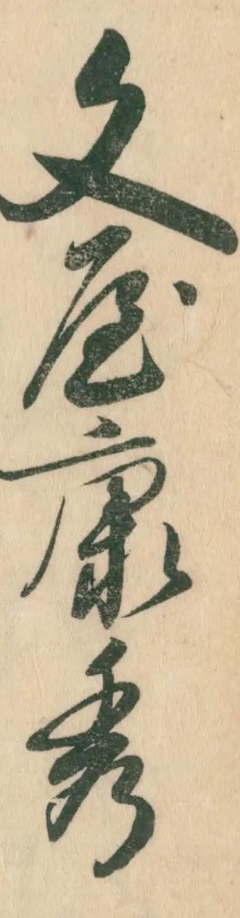文屋康秀
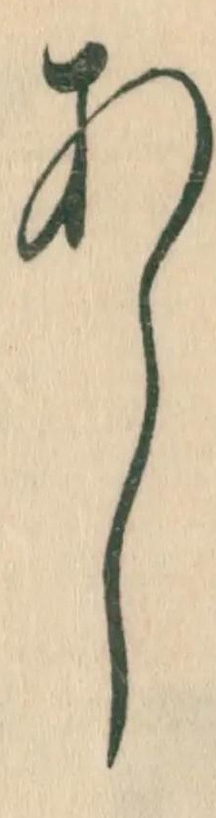あらし
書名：錦百人一首あつま織
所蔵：国立国会図書館 National Diet Library, JAPAN
